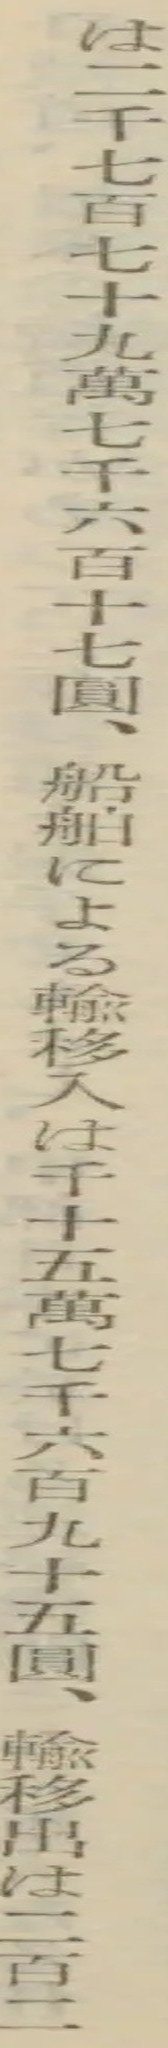は二千七百七十九万七千六百十七円、船舶による輸移入は千十五万七千六百九十五円、輸移出は二百二
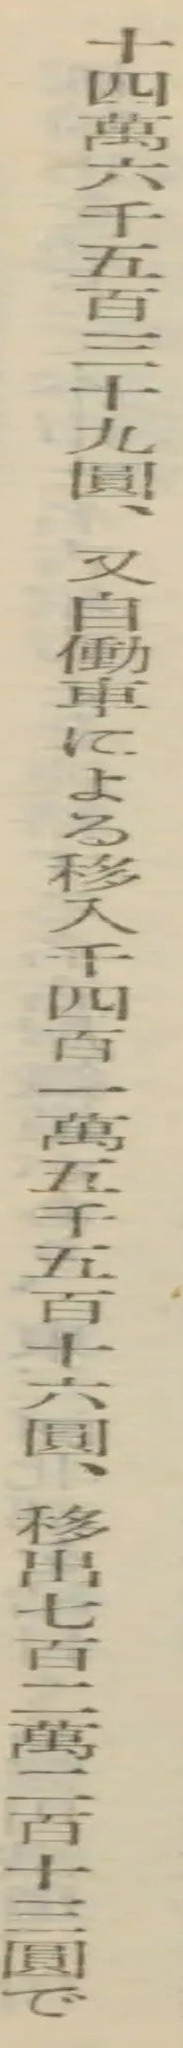十四万六千五百三十九円、又自働車による移入千四百一万五千五百十六円、移出七百二万二百十三円で
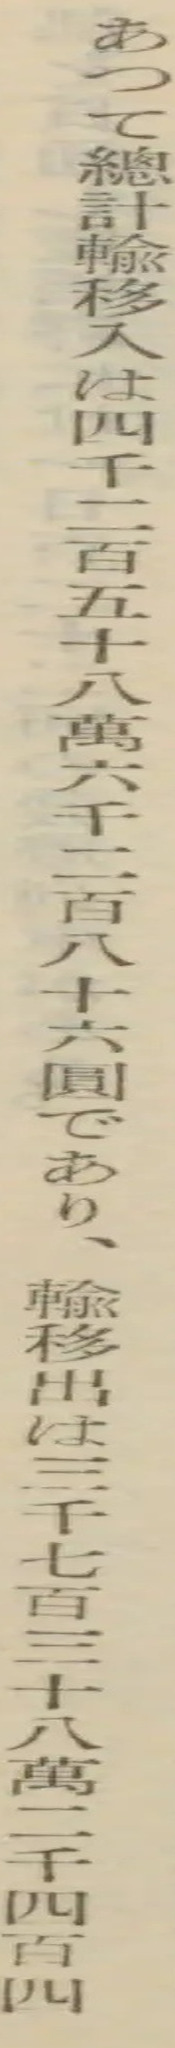あつて総計輸移入は四千二百五十八万六千二百八十六円であり、輸移出は三千七百三十八万二千四百四
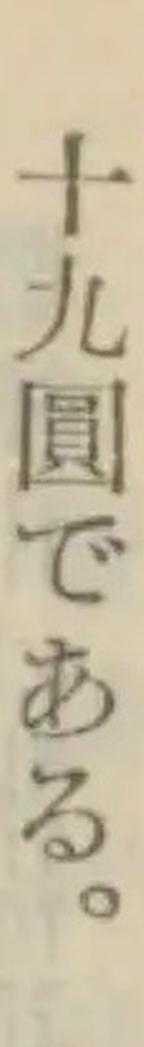十九円である。
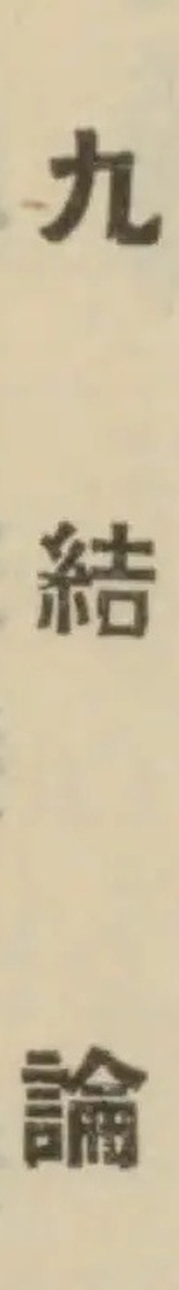九結論
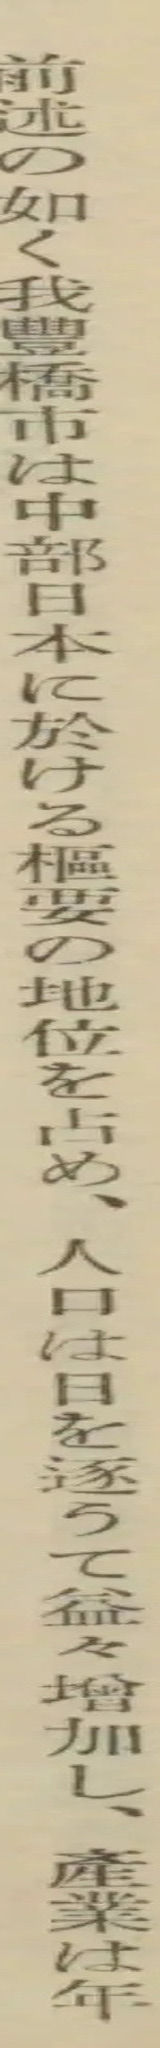前述の如く我豊橋市は中部日本に於ける枢要の地位を占め、人口は日を逐うて益々増加し、産業は年
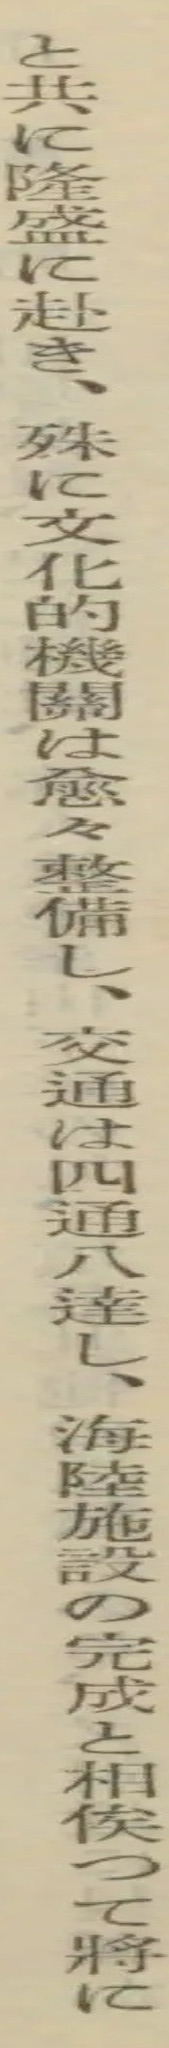と共に隆盛に赴き、殊に文化的機関は愈々整備し、交通は四通八達し、海陸施設の完成と相俟つて将に
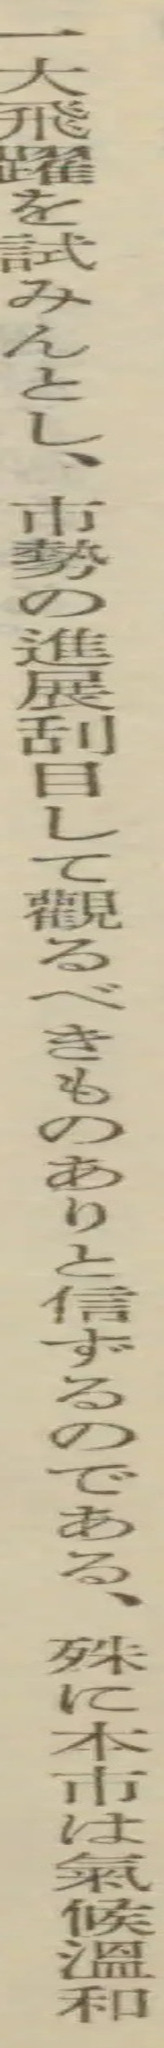一大飛躍を試みんとし、市勢の進展刮目して観るべきものありと信ずるのである、殊に本市は気候温和
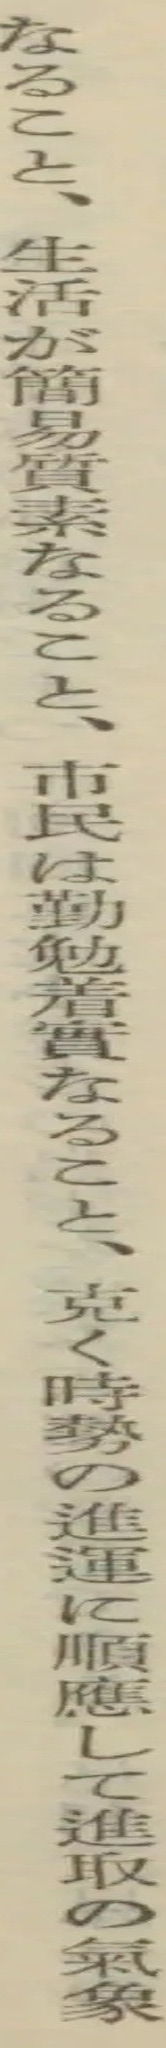なること、生活が簡易質素なること、市民は勤勉着実なること、克く時勢の進運に順応して進取の気象
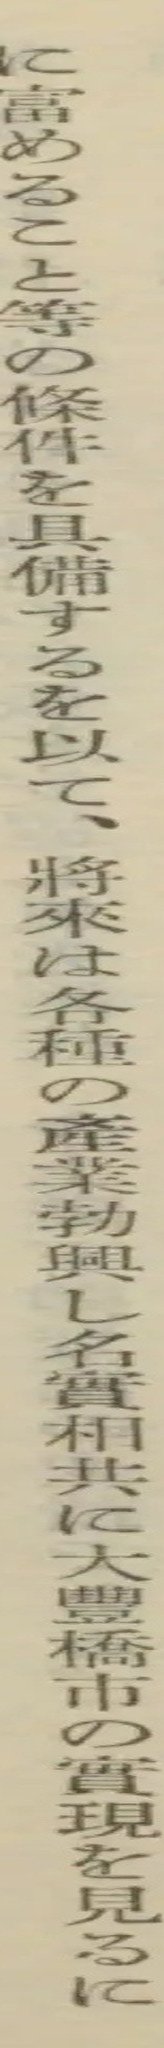に富めること等の条件を具備するを以て、将来は各種の産業勃興し名実相共に大豊橋市の実現を見るに
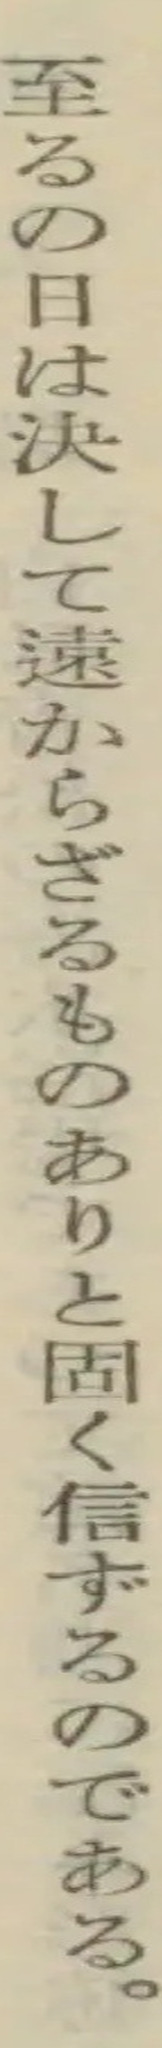至るの日は決して遠からざるものありと固く信ずるのである。
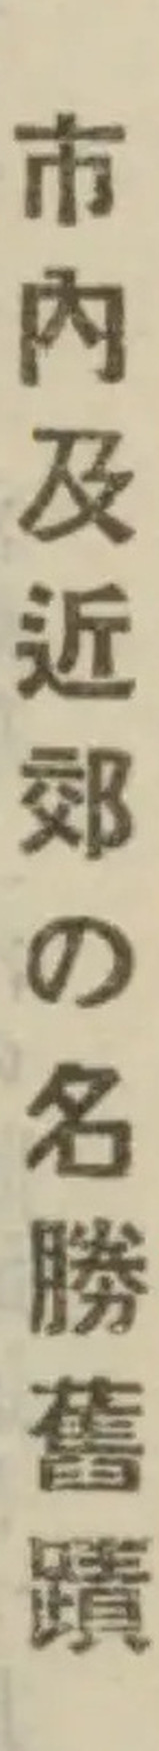市内及近郊の名勝旧蹟
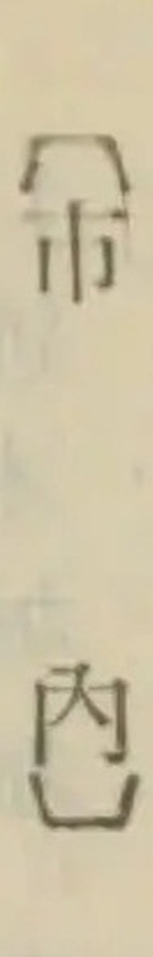(市内)
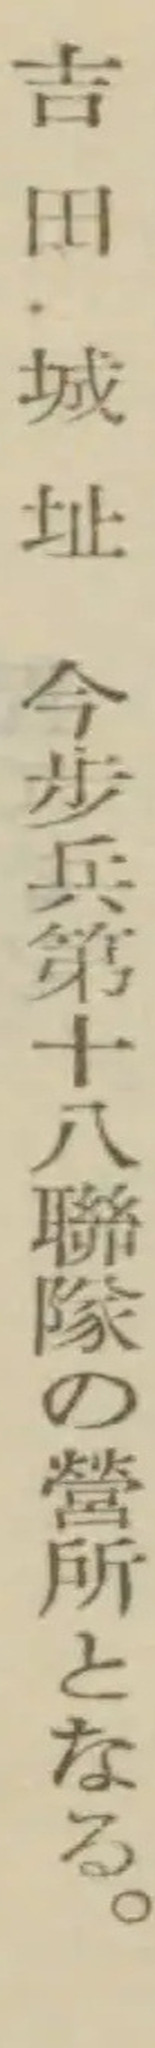吉田城址今歩兵第十八聯隊の営所となる。
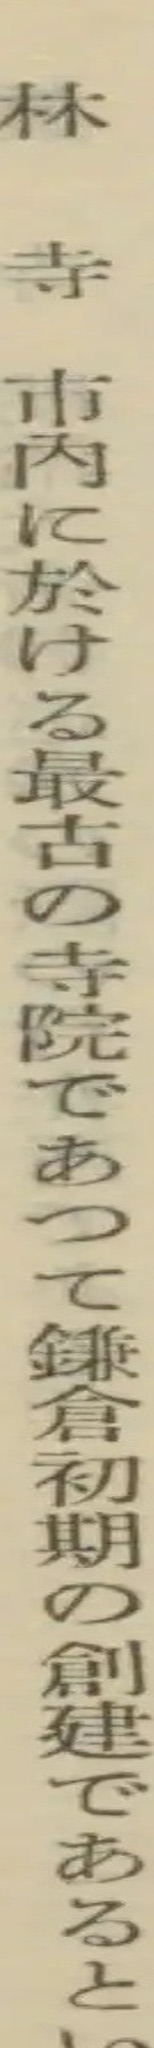正林寺市内に於ける最古の寺院であつて鎌倉初期の創建であるといふ。
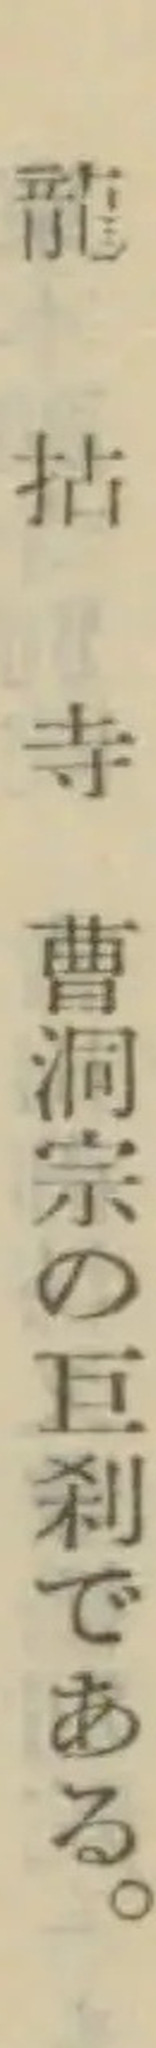龍拈寺曹洞宗の巨刹である。
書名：産業の豊橋
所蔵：国立国会図書館 National Diet Library, JAPAN
